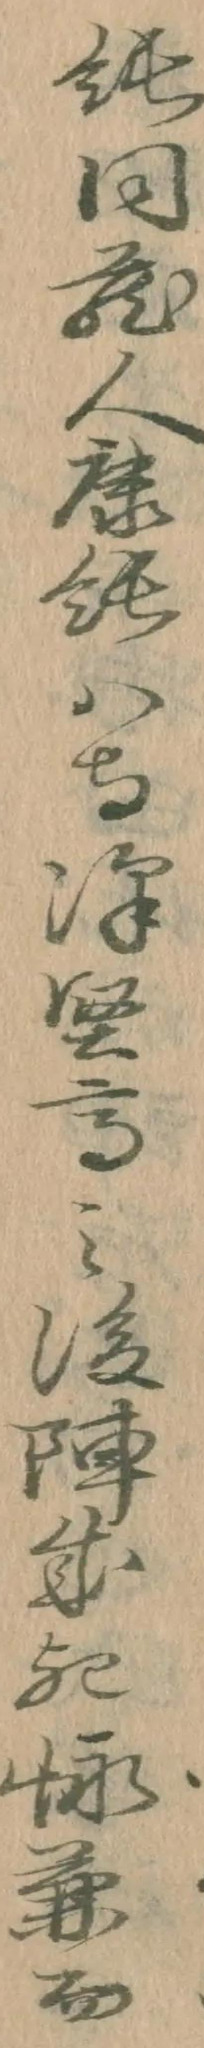純同蔵人康純は寺沢堅高之後陣成歟懶兼而
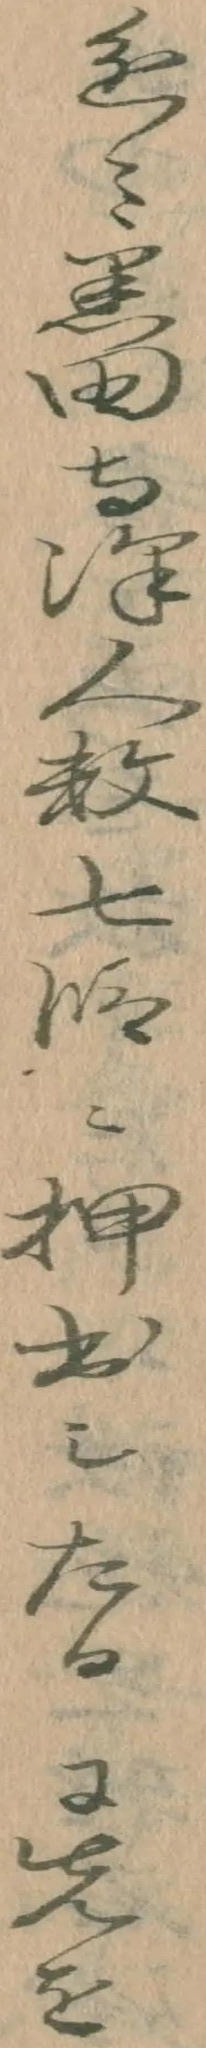進み黒田寺沢人数七段に押出したる尓先を
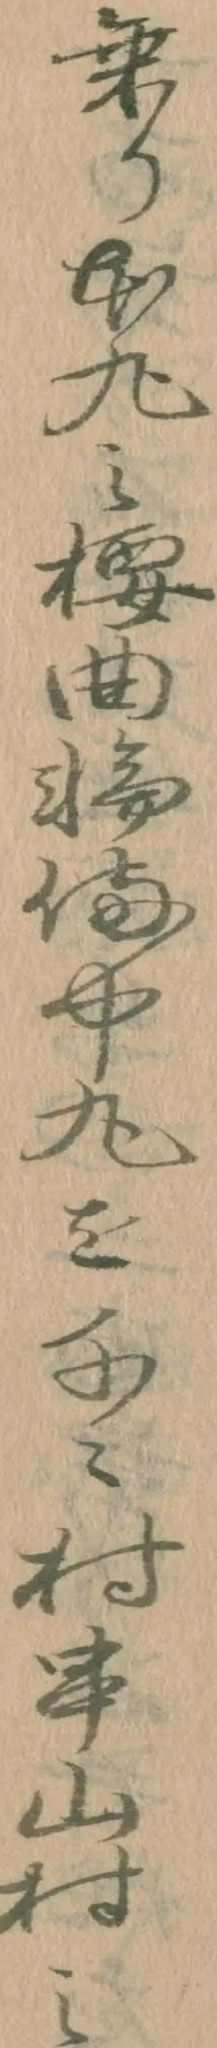乗り本丸之腰曲輪備中丸を千々村串山村之
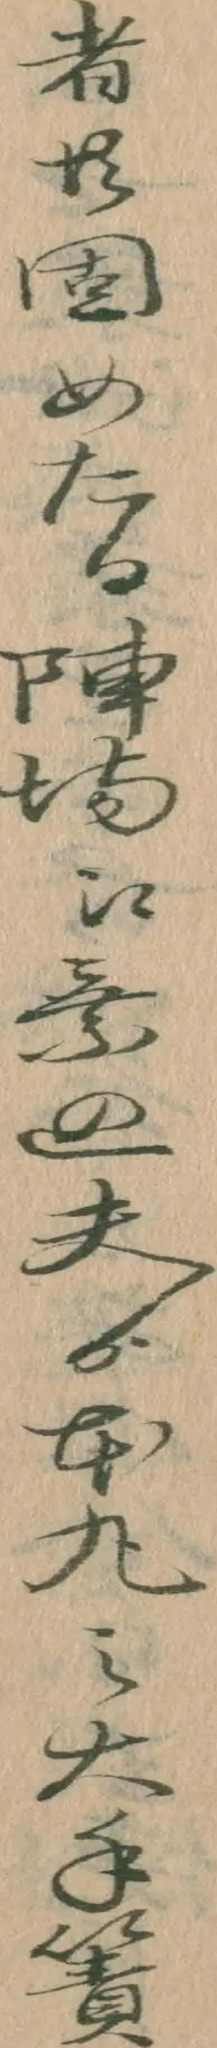者共固めたる陣場江乗込夫ゟ本丸之大手簀
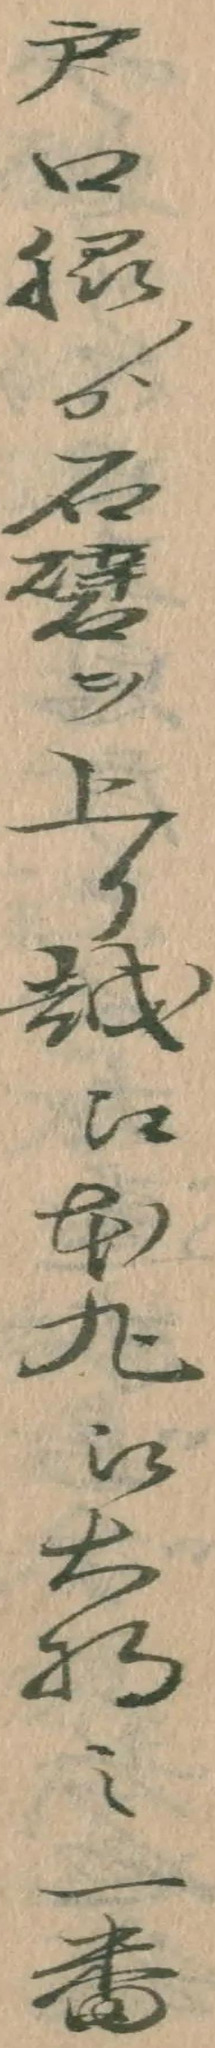戸口脇ゟ石壁を上り越江本丸江大将之一番
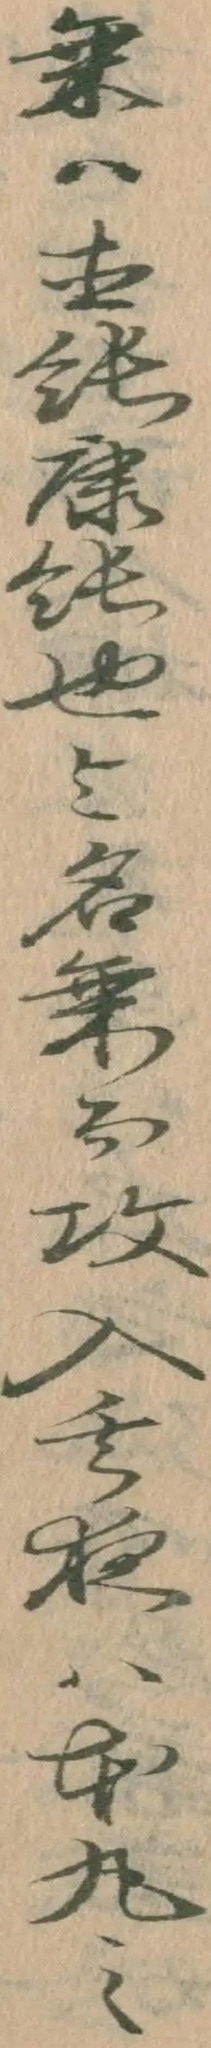乗は直純康純也与名乗而攻入其夜は本丸之
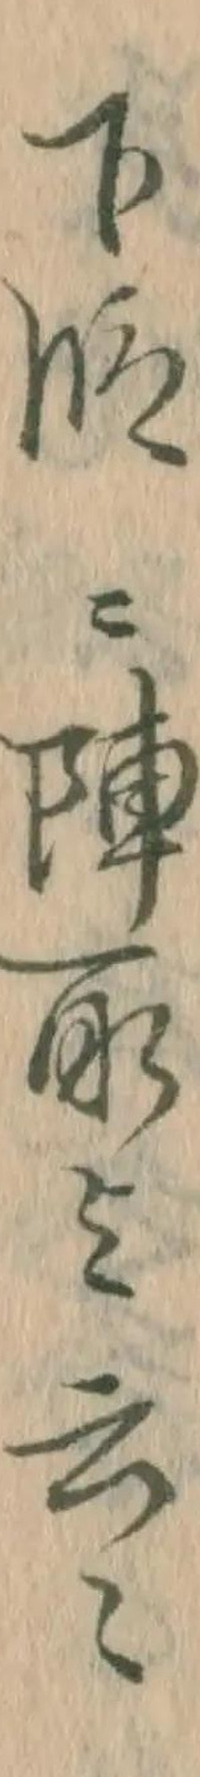下段に陣取与云々
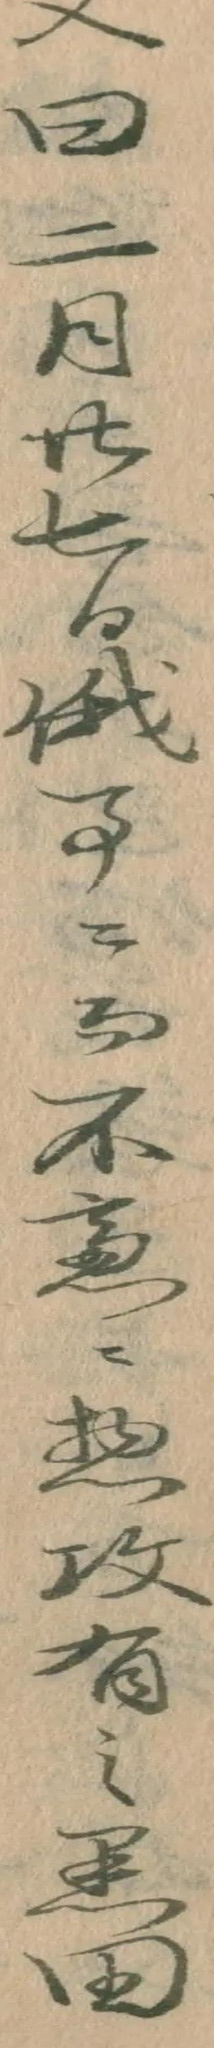又曰二月廿七日俄事に而不慮に惣攻有之黒田
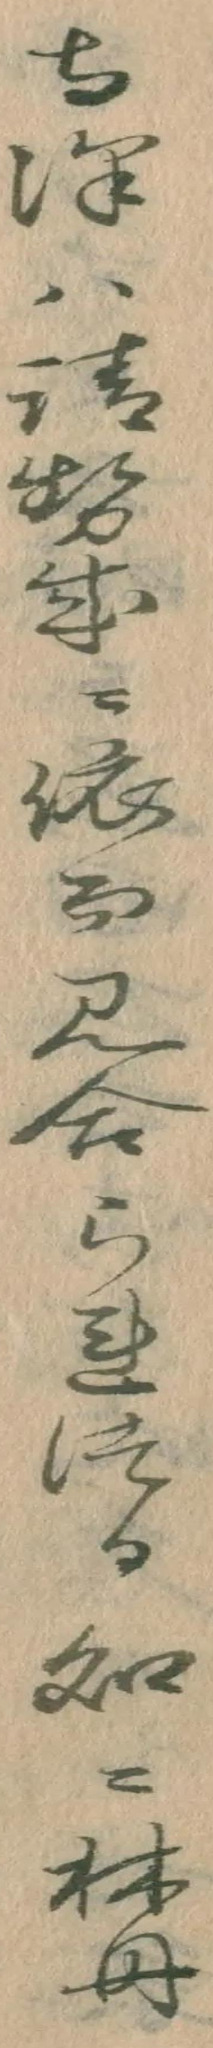寺沢は請勢成に依而見合ら連徒る処に林丹
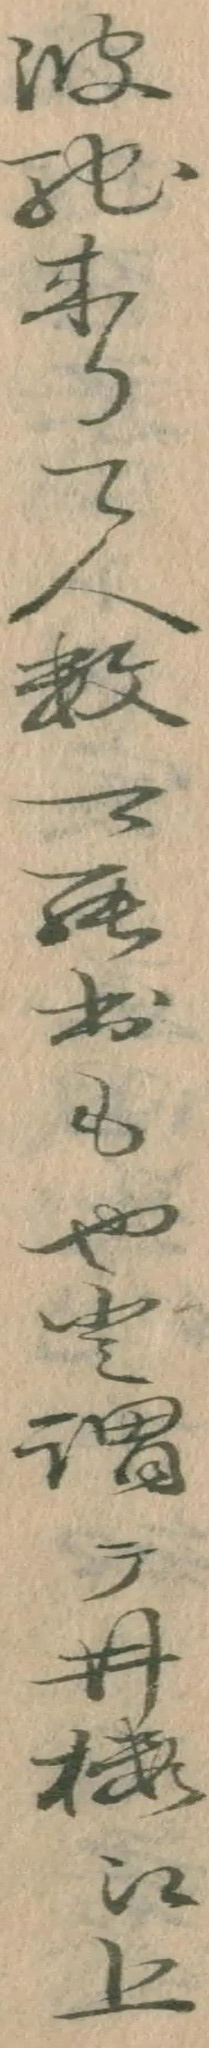波馳来りて人数可罷出もや登謂て井樓江上
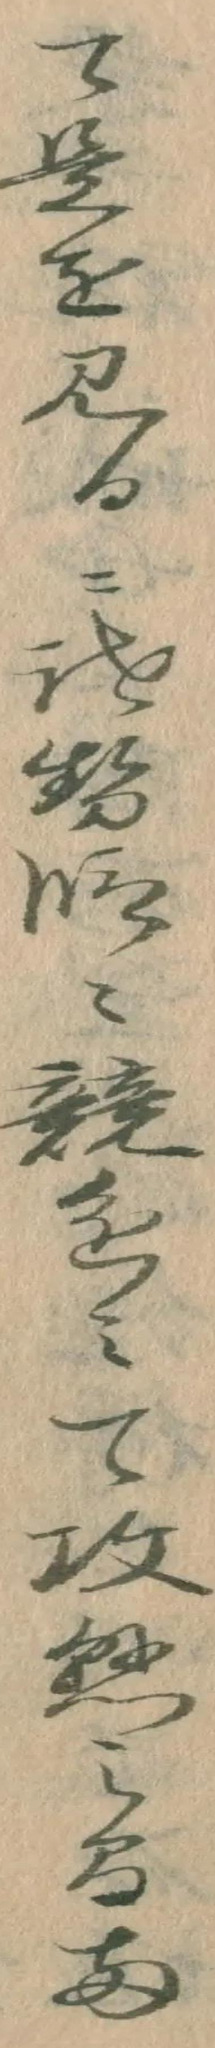て是を見るに諸勢段々競進みて攻懸之間両
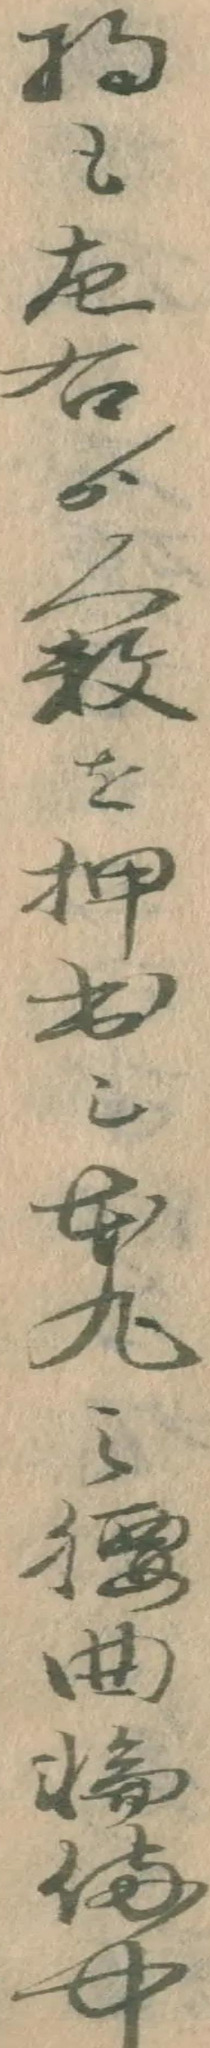将も左右ゟ人数を押出し本丸之腰曲輪備中
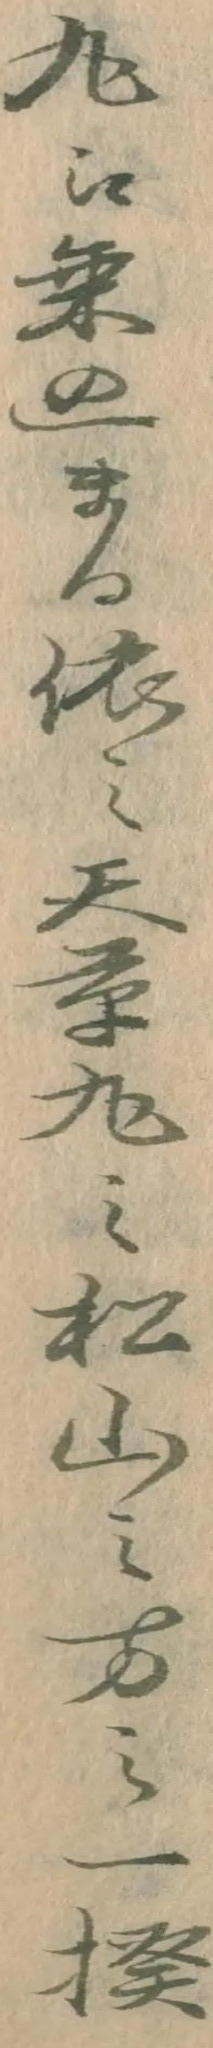丸江乗込まる依之天草丸之松山之方之一揆

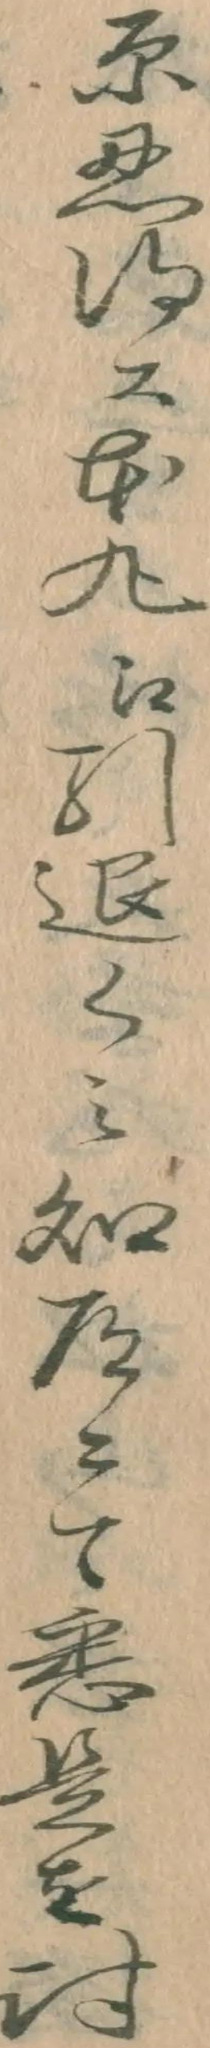原忍得す本丸江引退く之処道にて悉是を討
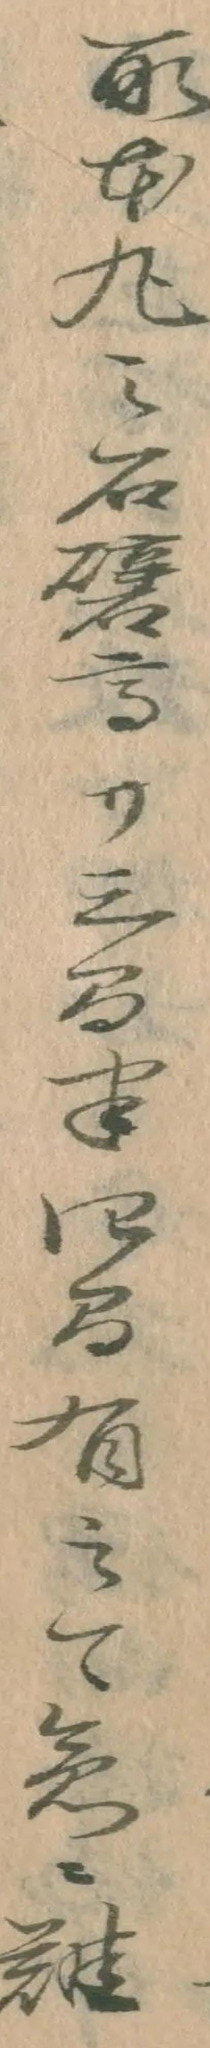取本丸之石壁高さ三間半四間有之て急に難
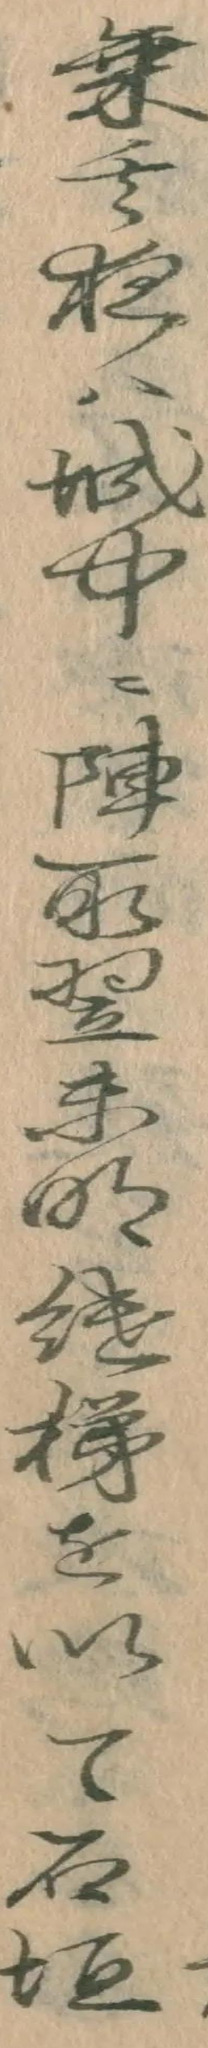乗其夜は城中に陣取翌未明鑓梯を以て石垣
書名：切支丹御退治記 49巻. [7]
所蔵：国立国会図書館 National Diet Library, JAPAN
